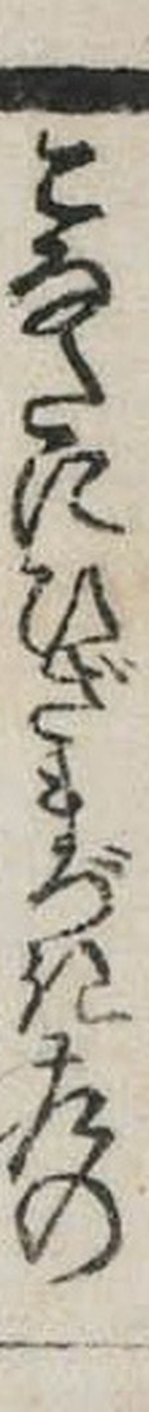こなたにひざまづき左の
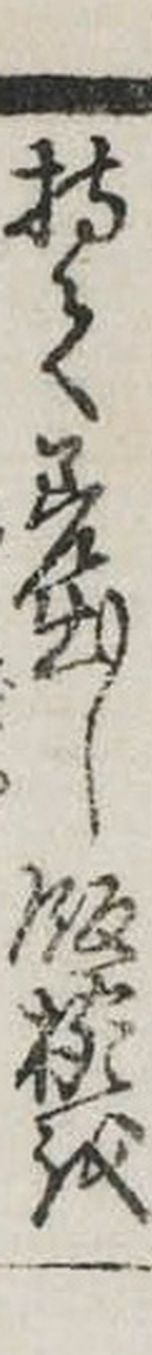持て差出し飯椀を
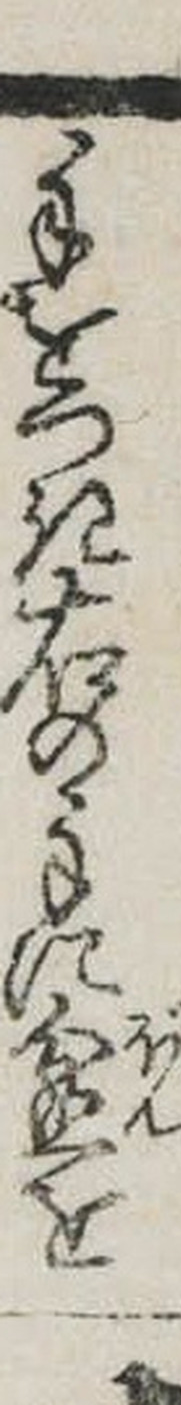手をつき右の手に盆を
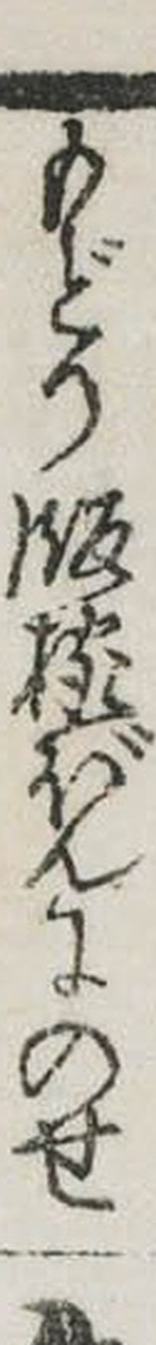もどり飯椀ぼんにのせ
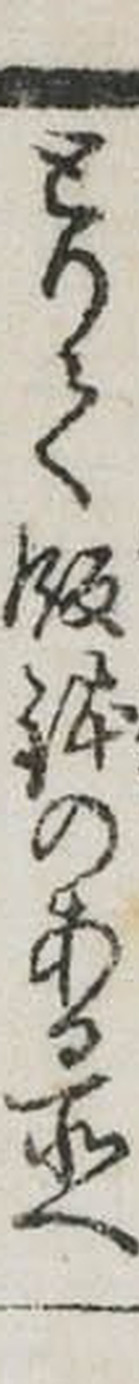とりて飯鉢のある所へ
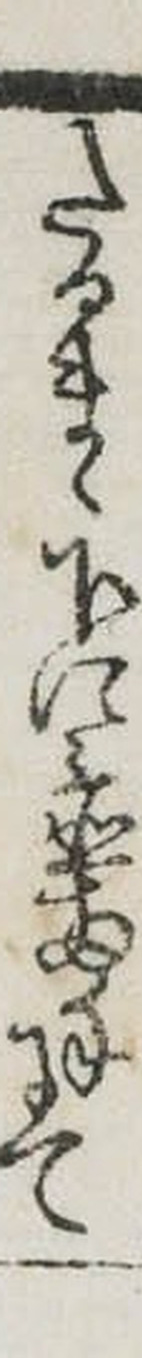たるまゝ下に置両手にて
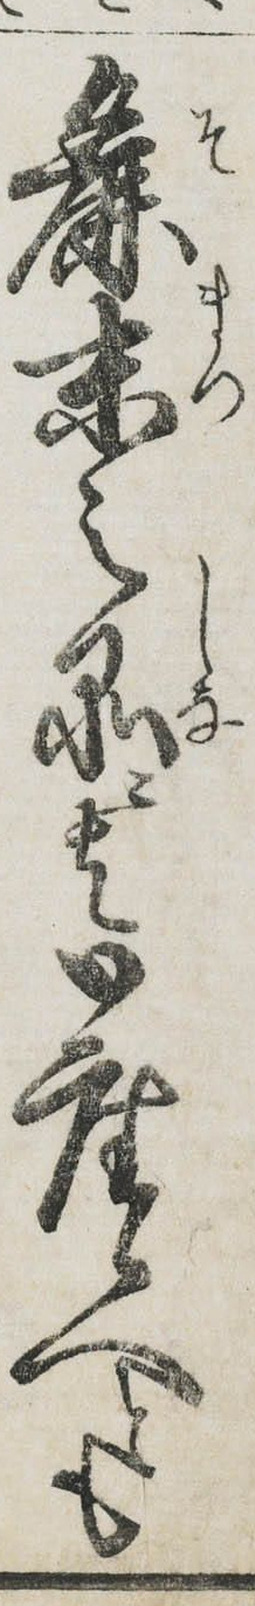麁末之品には御座候へとも
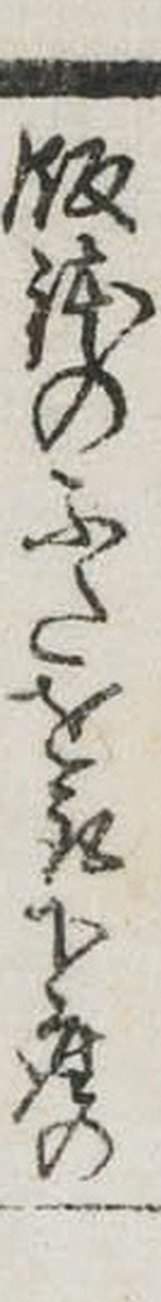飯鉢のふたを取下座の
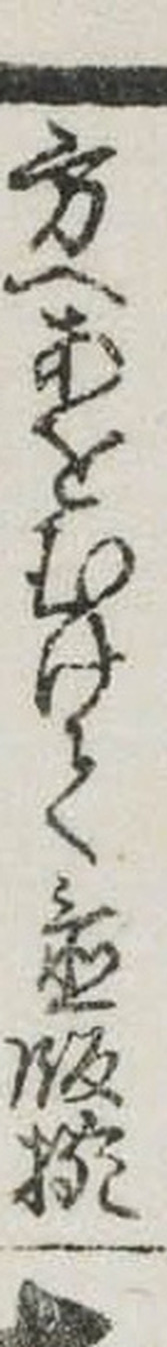方へあおむけて置飯椀
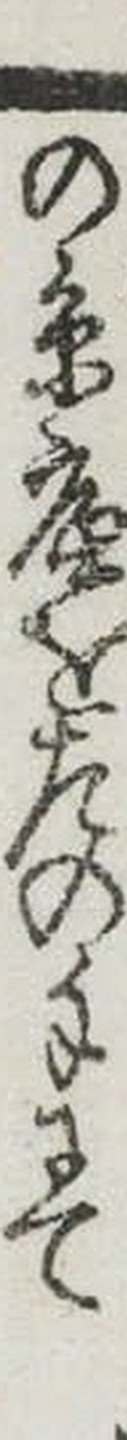の糸底を左の手にて
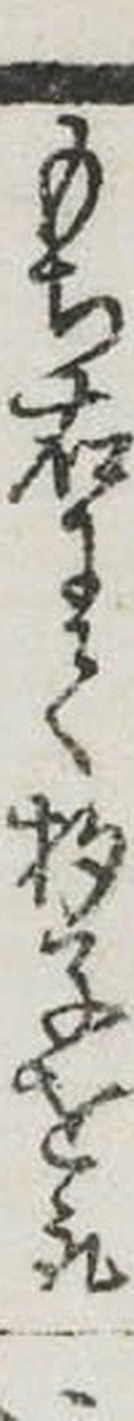もち右にて杓子を取
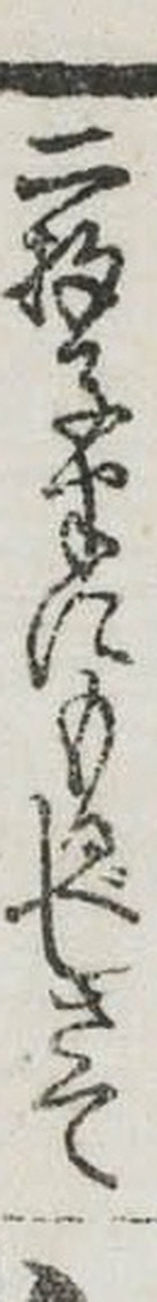二杓子半にもるべしさて
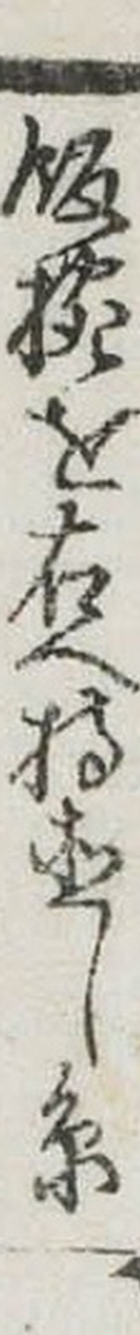飯椀を右へ持直し糸
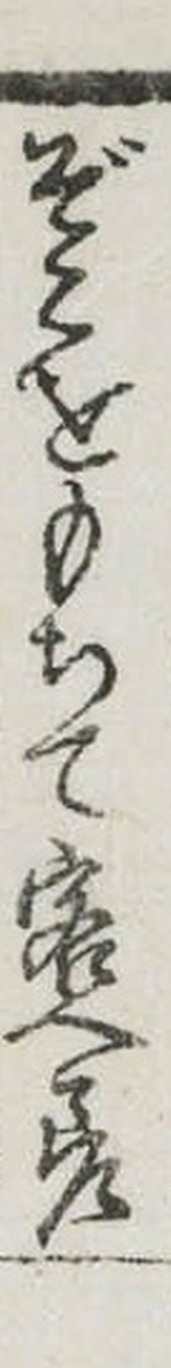ぞこをもちて客へ差
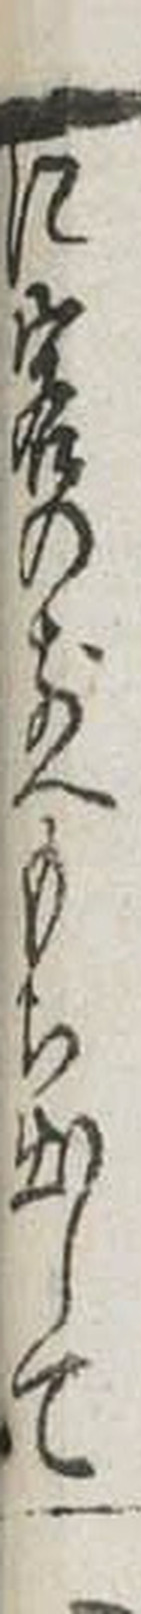に客の前へもち出して
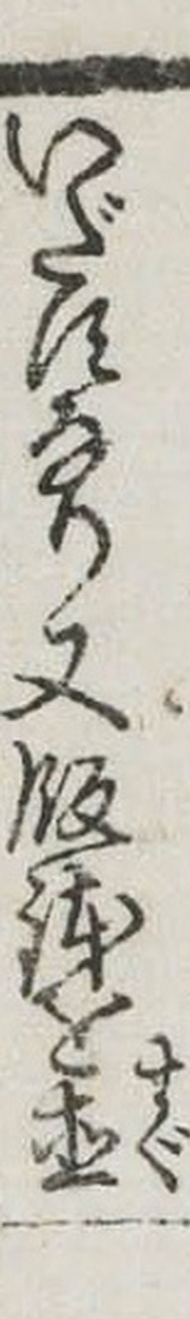いだすなり又飯鉢を直
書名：頭書萬用婦人手紙之文言
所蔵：東京学芸大学教育コンテンツアーカイブ
